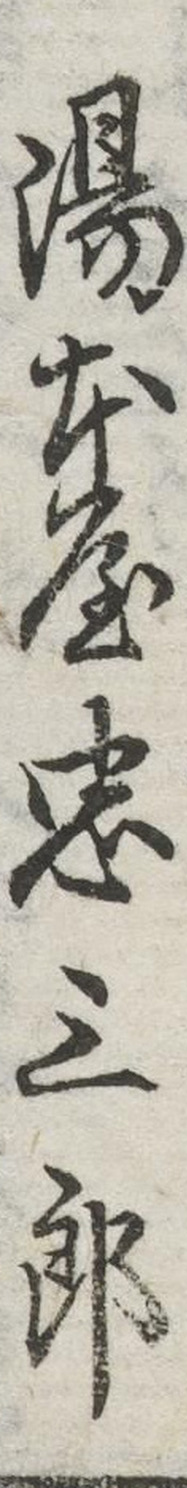湯本屋忠三郎
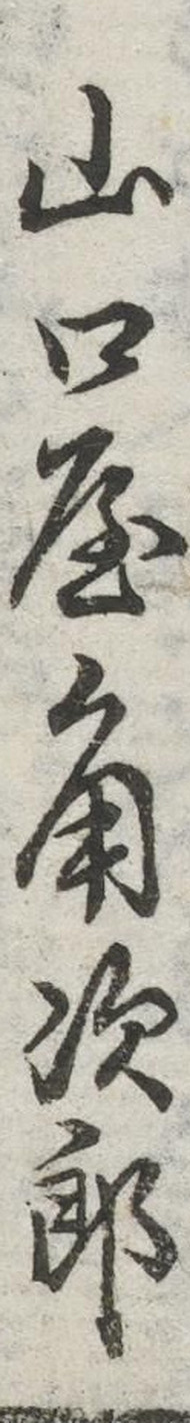山口屋角次郎

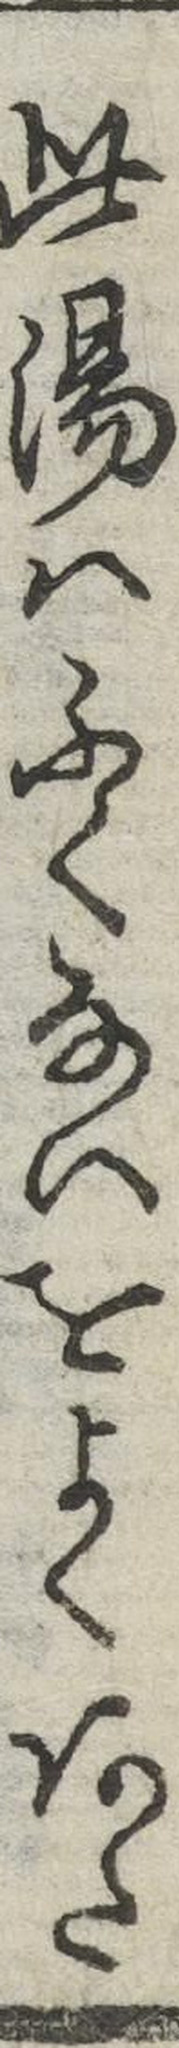此湯はふくないをよくあた
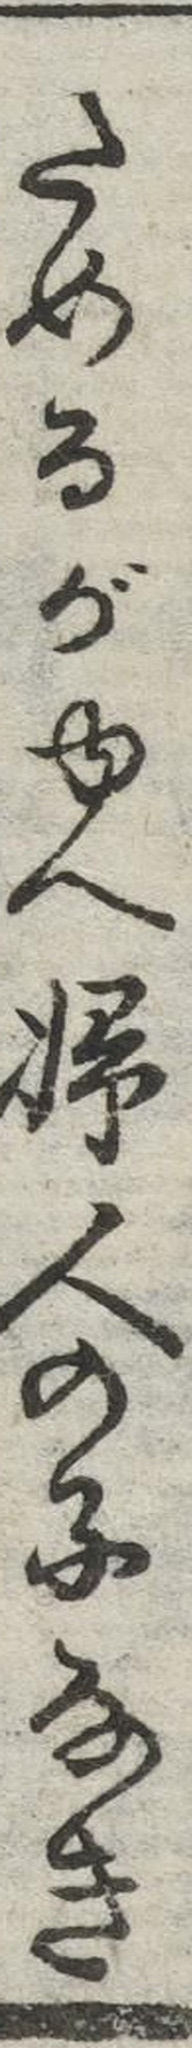ためるがゆへ婦人の子なき
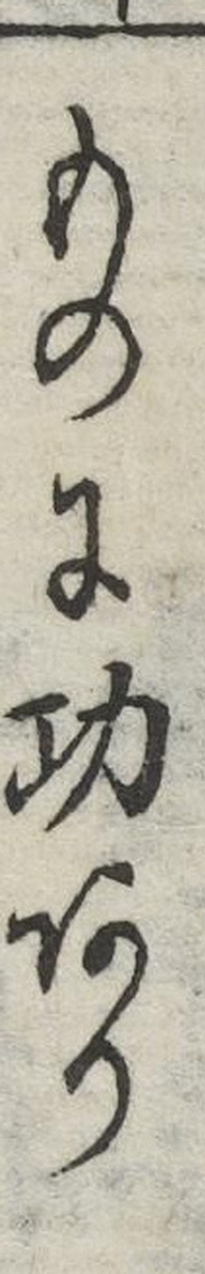ものに功あり
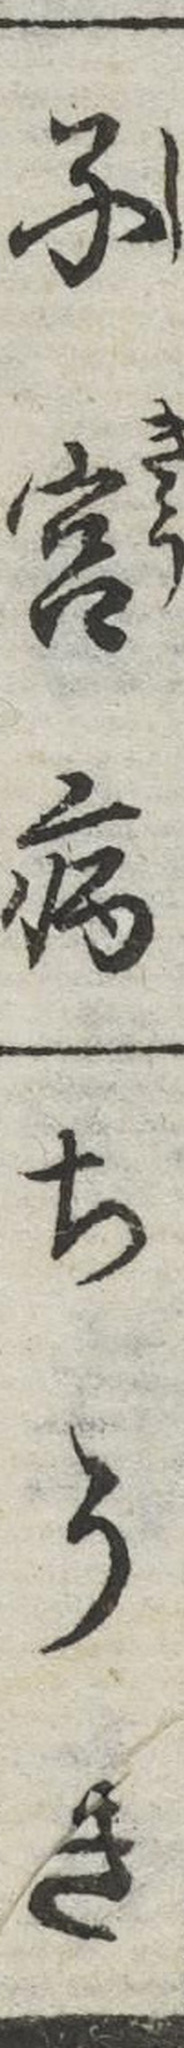子宮病ちうき
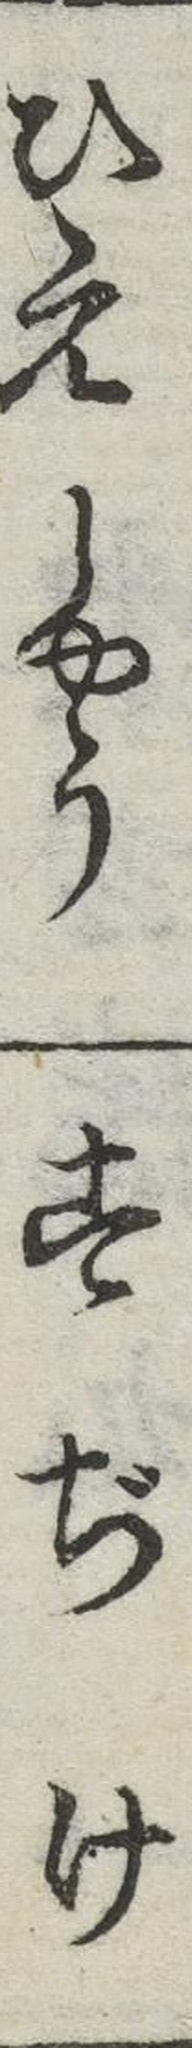ひえしやうすじけ
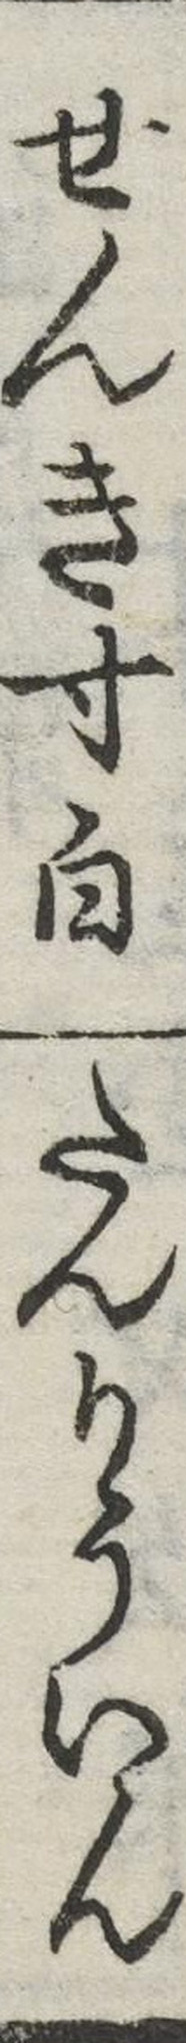せんき寸白たんりういん
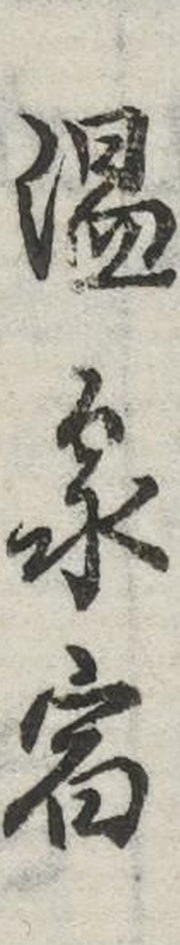温泉宿
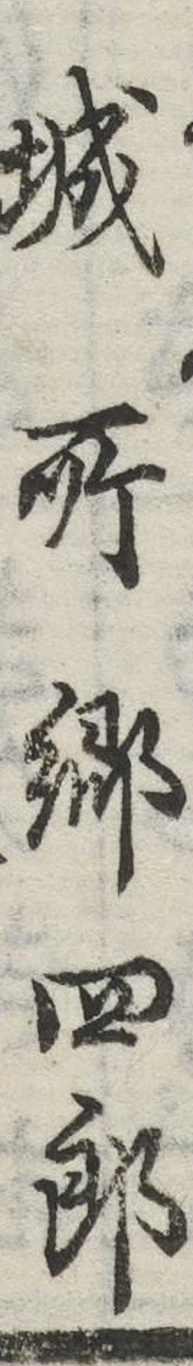城所郷四郎
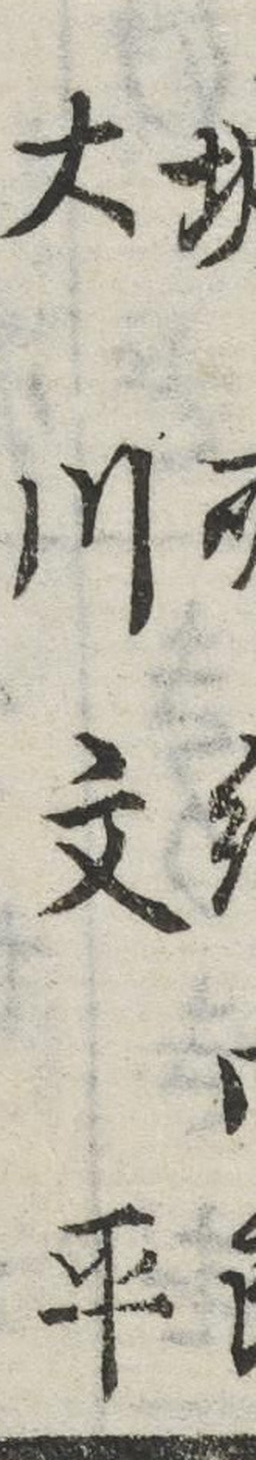大川文平
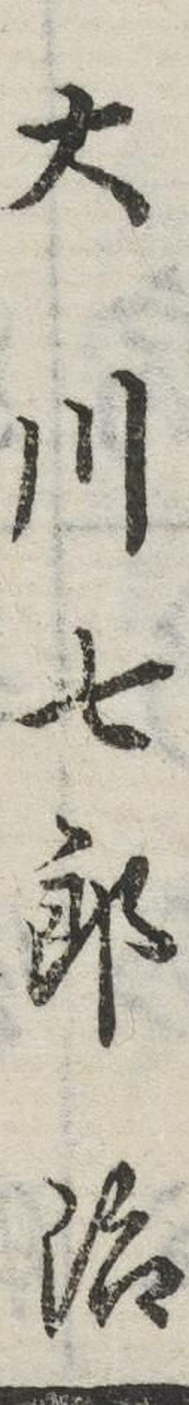大川七郎治
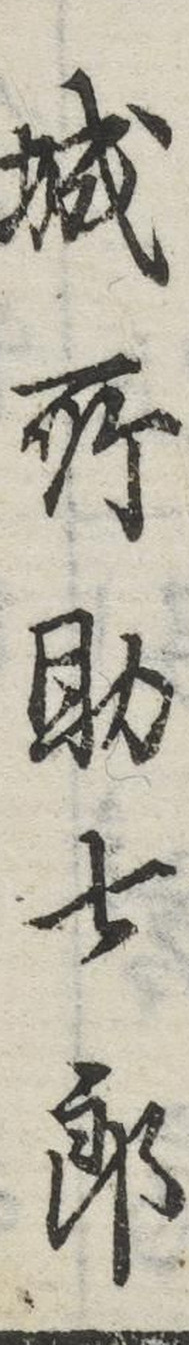城所郷四郎
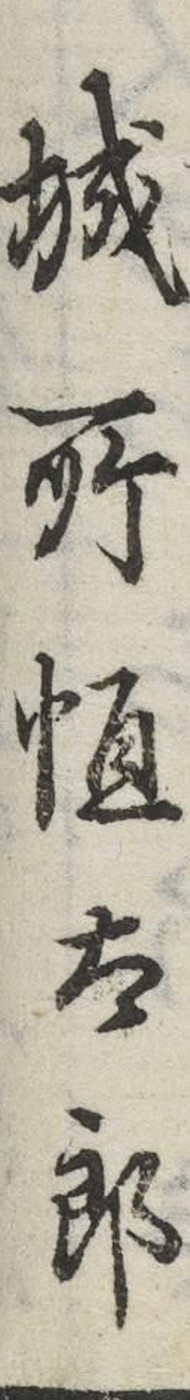城所新太郎
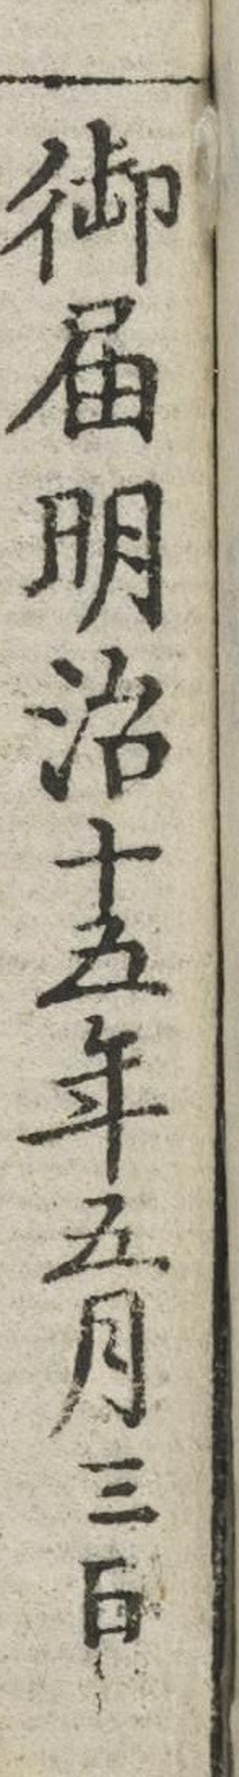御届明治十五年五月三日
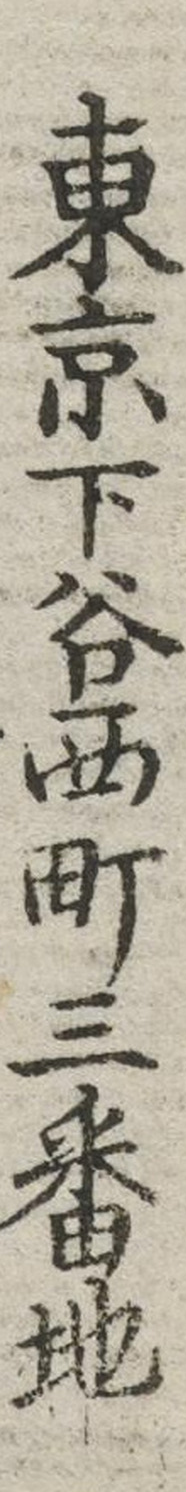東京下谷西町三番地
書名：諸國温泉遊覽記　全
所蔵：東京大学地震研究所図書室 Earthquake Research Institute Library, The University of Tokyo, JAPAN
